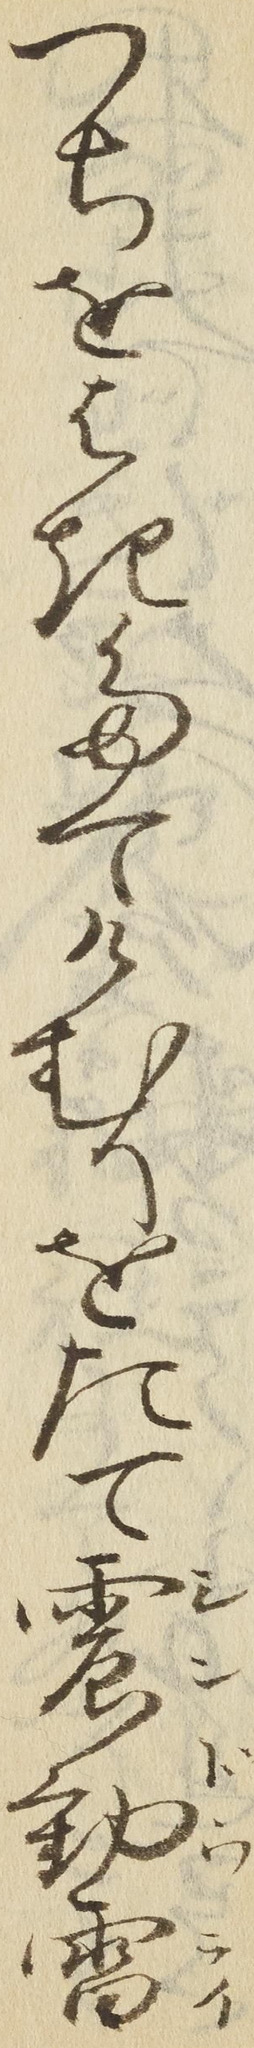つちをはきたてけむりをたて震動雷
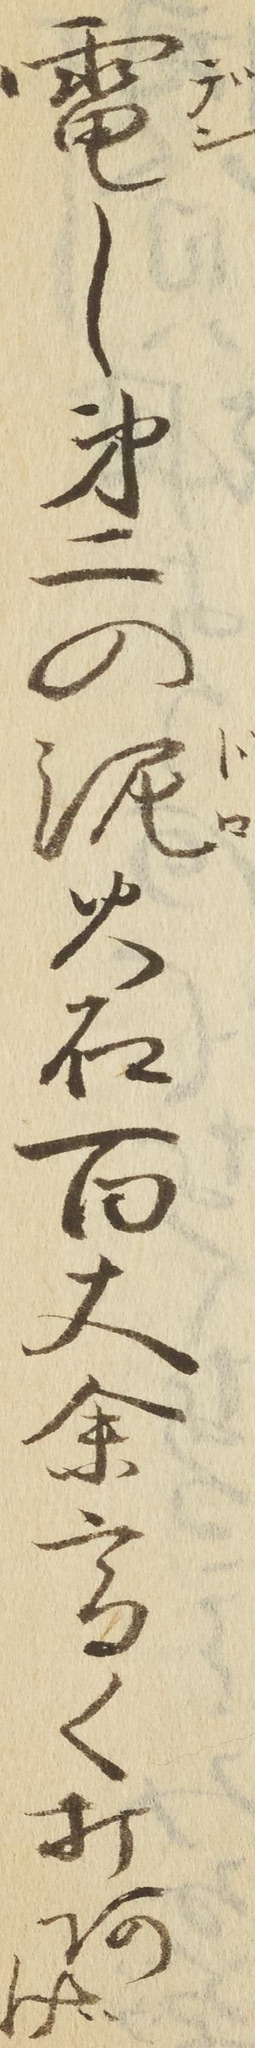電し第二の泥大石百丈余高く打あげ
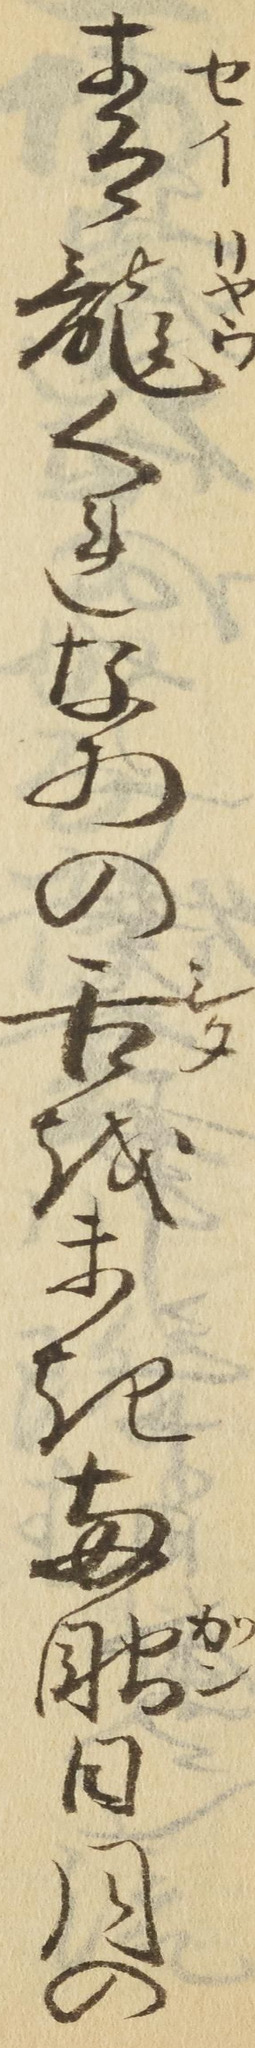青龍くれなゐの舌をおき両眼日月の
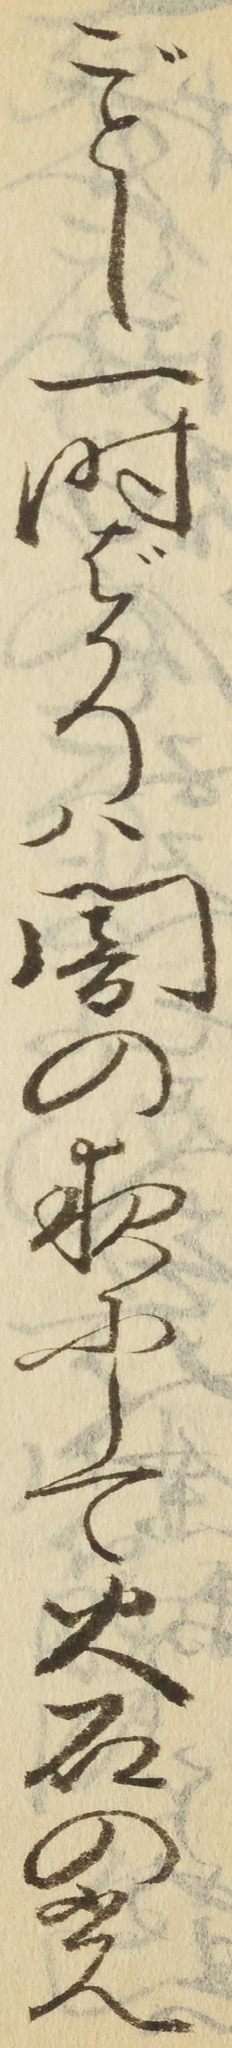ごとし一時ばかりは闇の夜にして大石の光
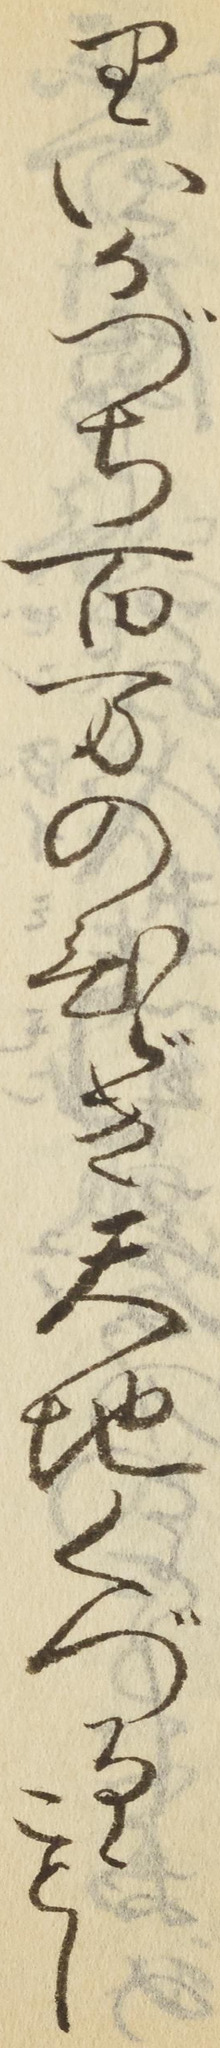りいかづち百万のひゞきてんちくづるゝことし
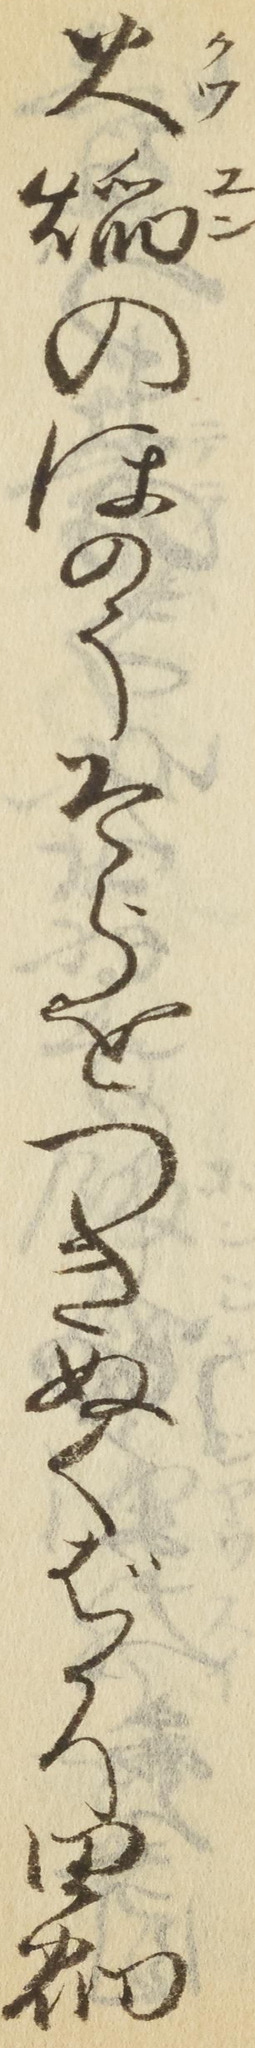火焔のほのうそらをつきぬくばかり田畑
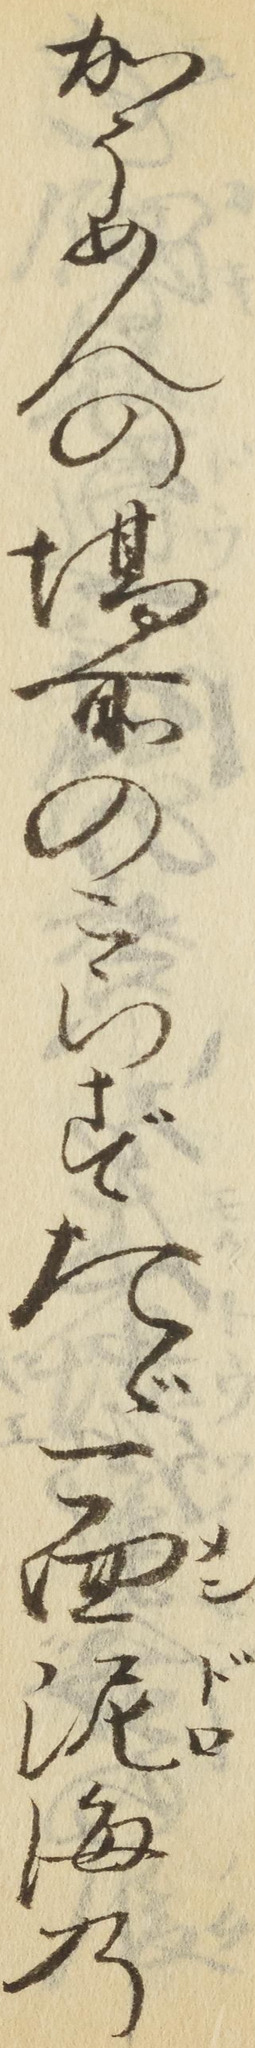かうめんの場所のこらずたゞ一面泥海の
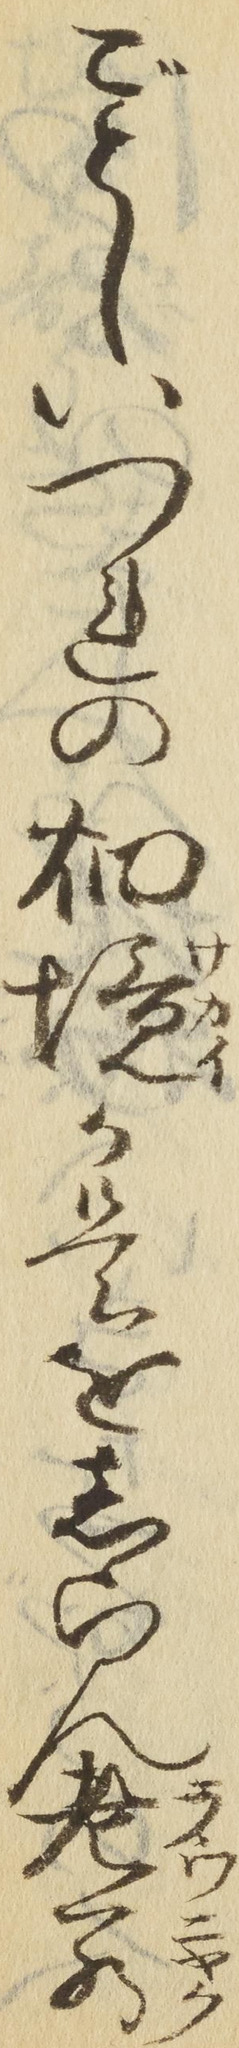ごとしいつれの畑境か是をしらん老若
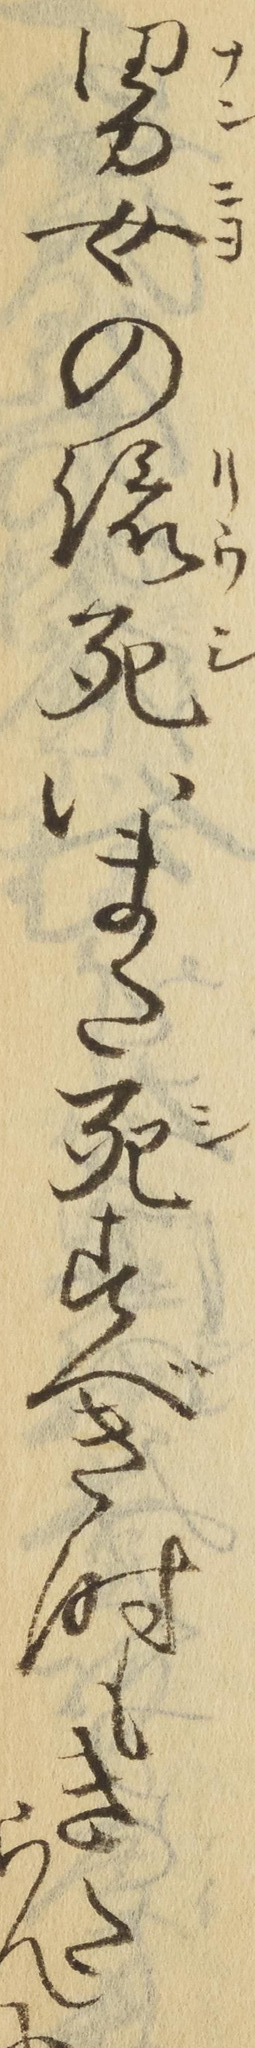男女の流死いまた死すべき時もきたらんと

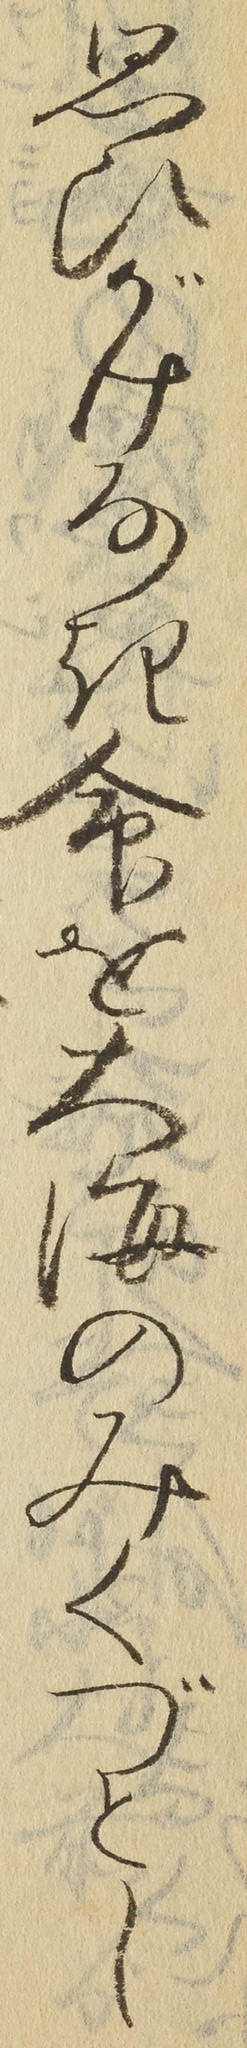思ひかけなき命を大海のみくづとし
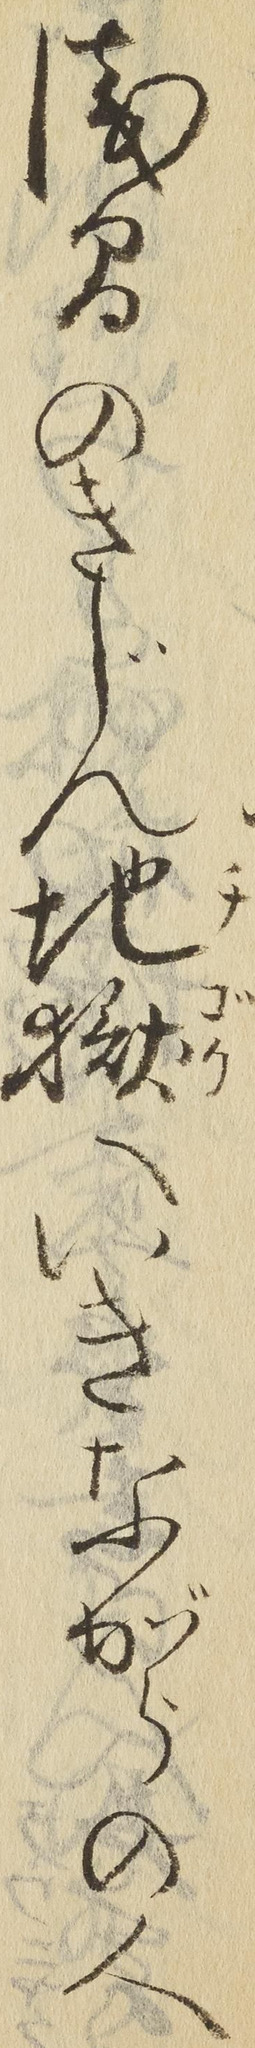浅間のきじん地獄へいきながらの人
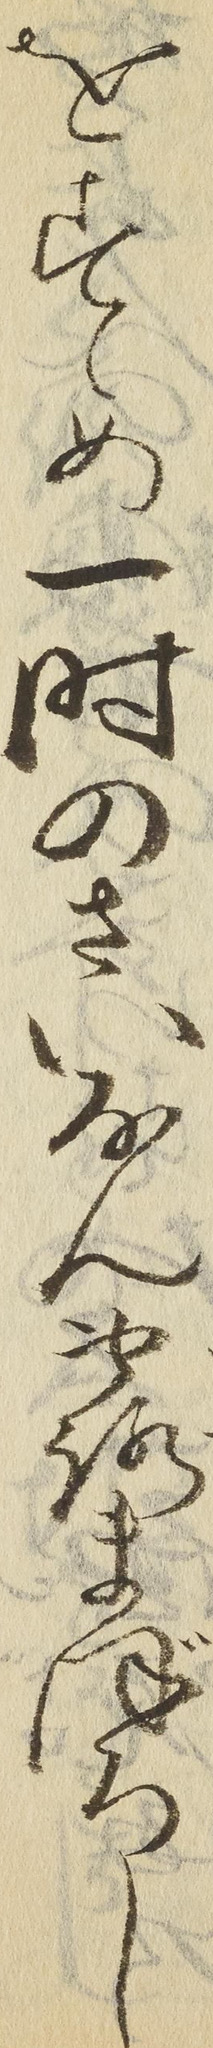をすゝめ一時のさいなん露まぼろし
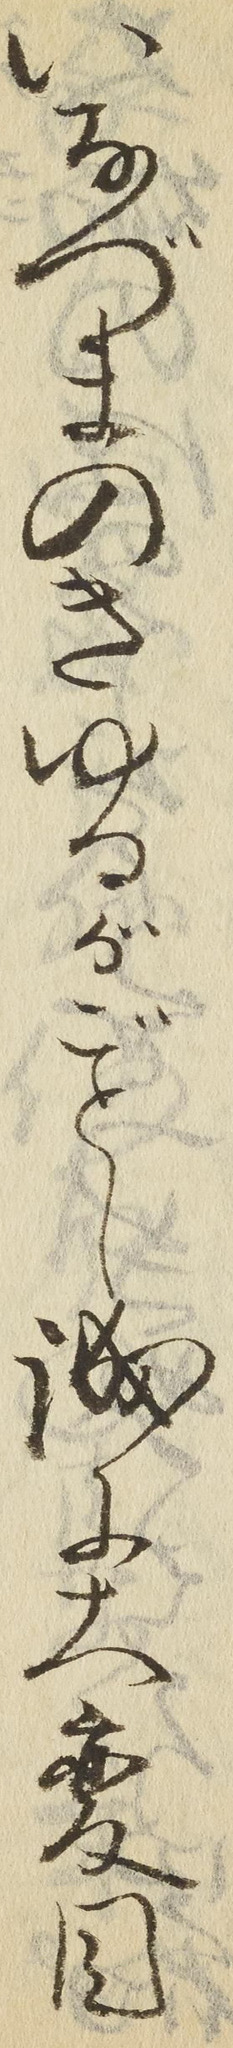いなつまのきゆるがごとし誠に大変目
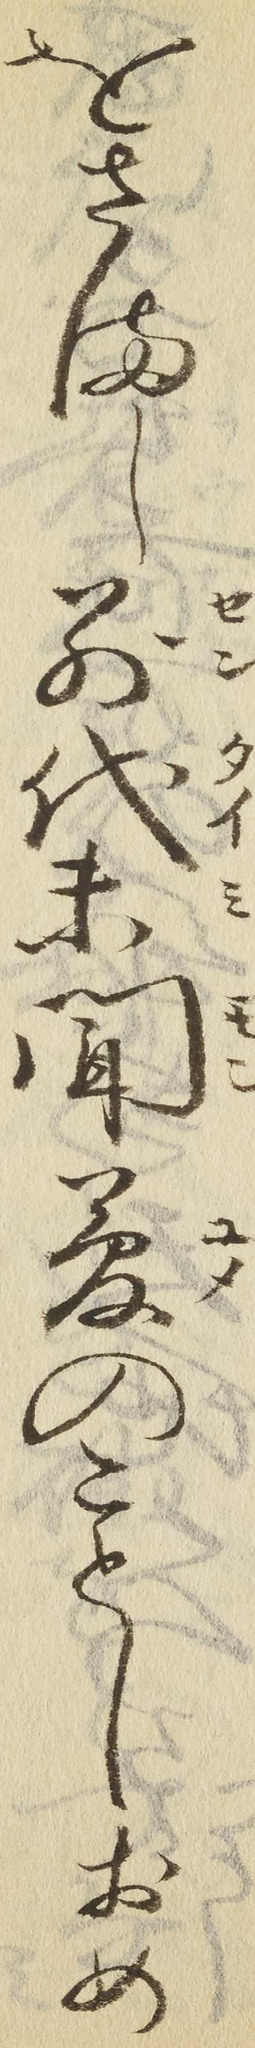をさまし前代未聞夢のことしおめ
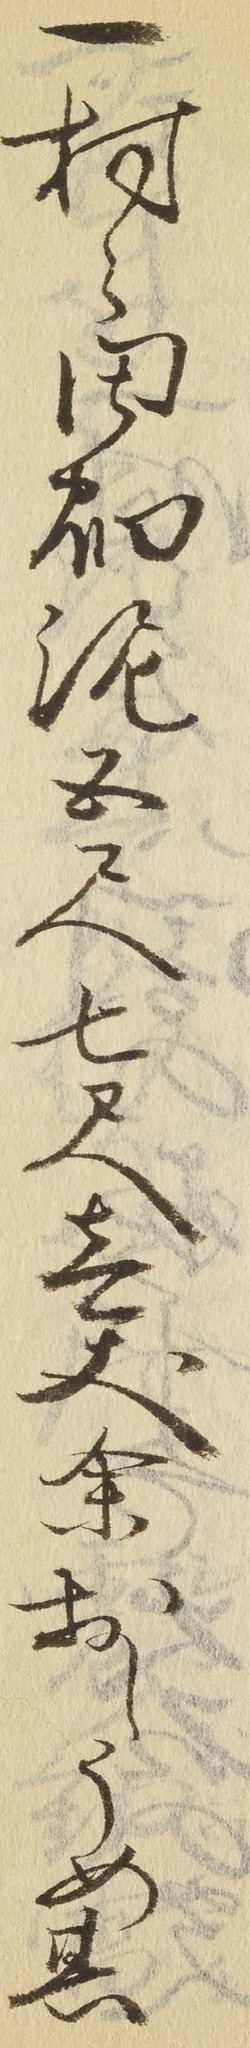一村々田畑泥五尺七尺壱丈余おしうめ其
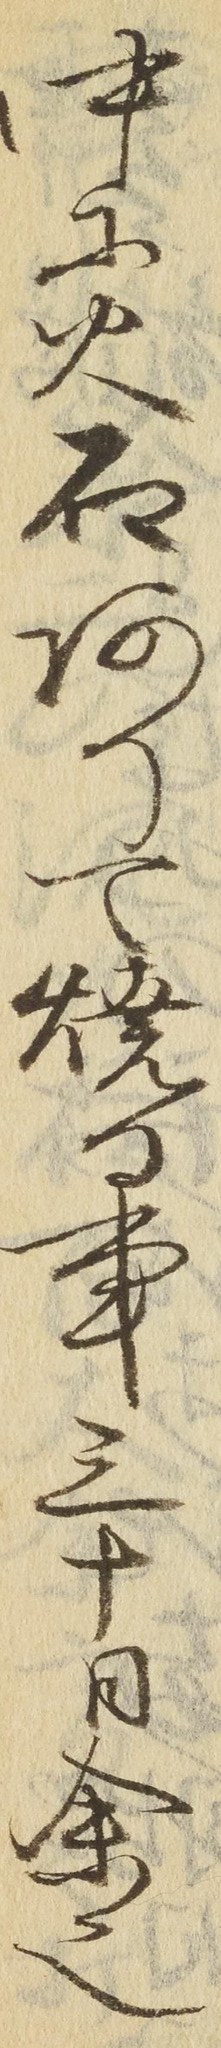中に火石ありて焼る事三十日余也
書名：浅間大變記
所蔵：東京大学地震研究所図書室 Earthquake Research Institute Library, The University of Tokyo, JAPAN
